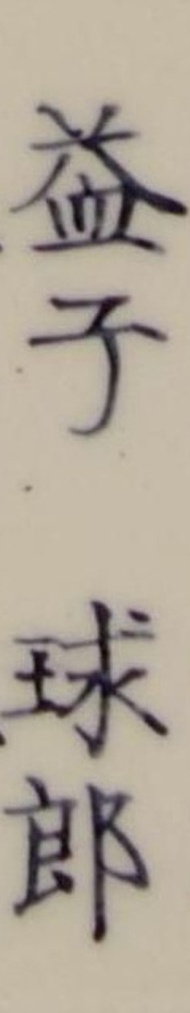益子球郎
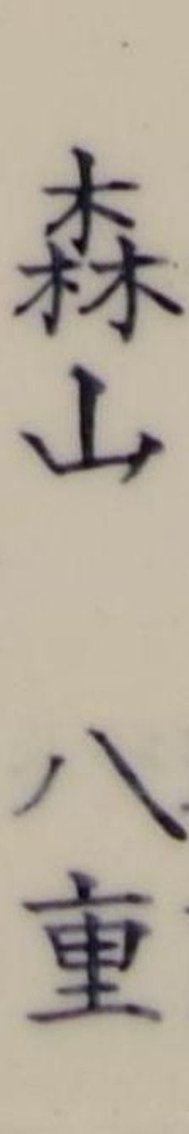森山八重
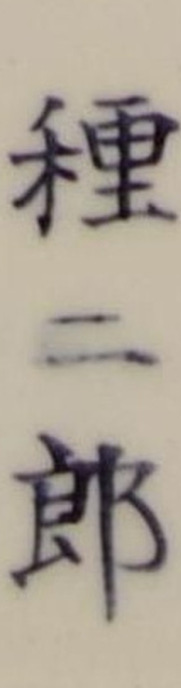種二郎
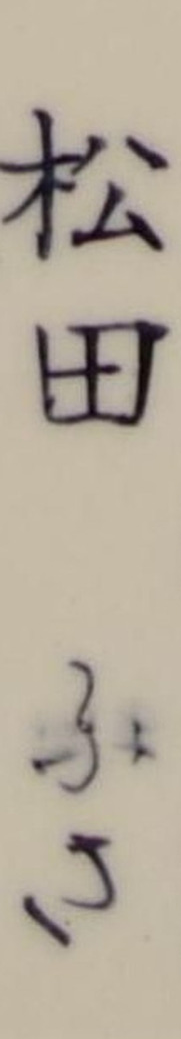松田ふさ
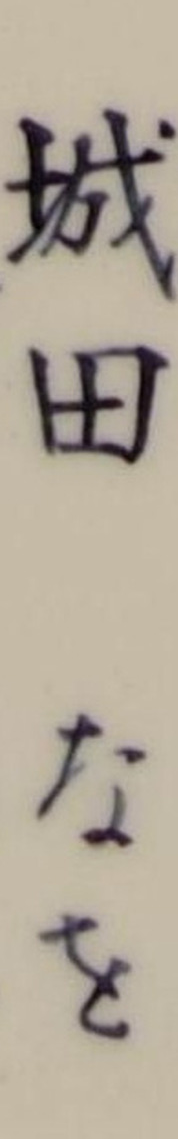城田なを
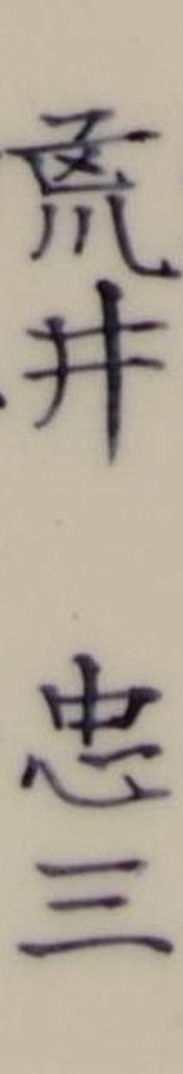荒井忠三
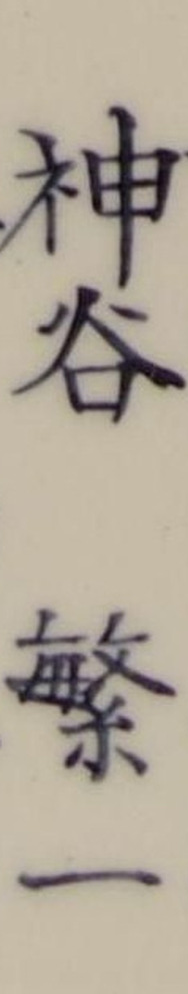神谷繁一
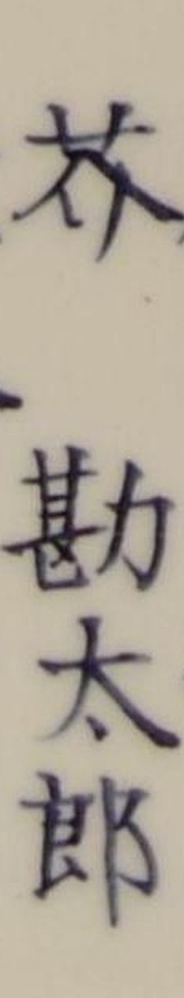芥勘太郎
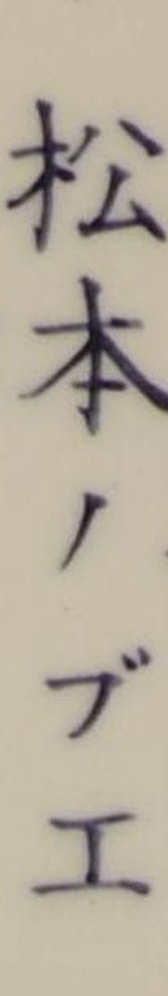松本ノブ工
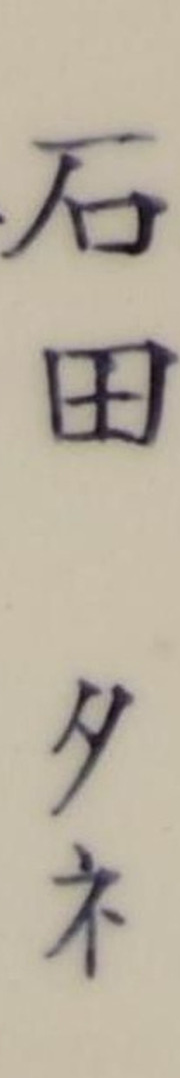石田夕ネ
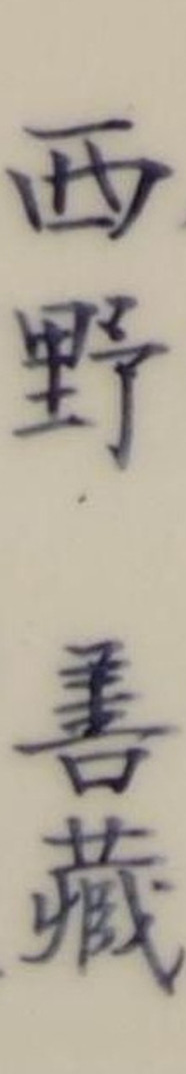西野善蔵
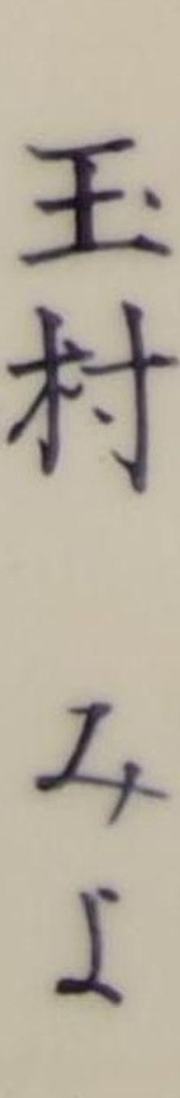玉村みよ
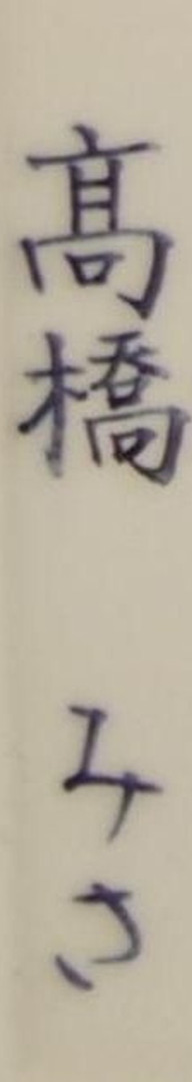高橋みさ

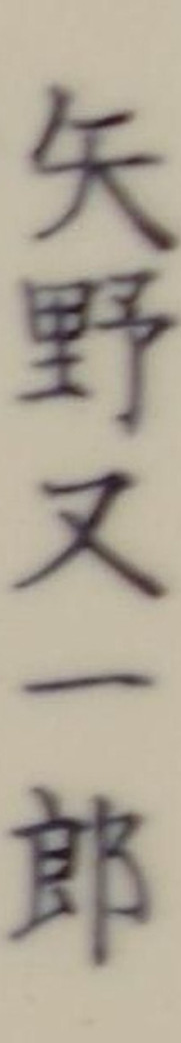矢野又一郎
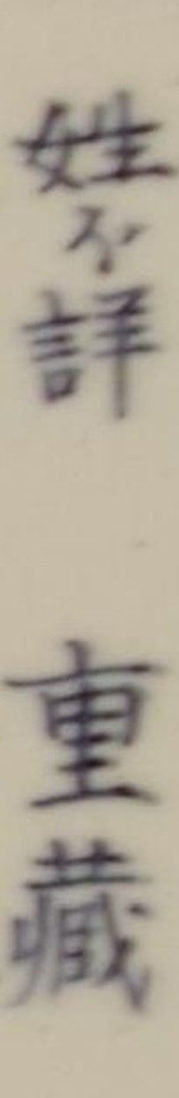姓不詳重蔵
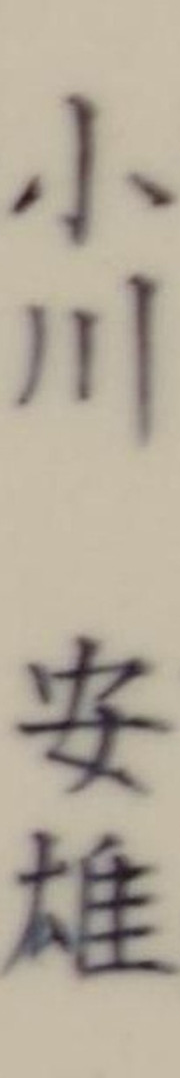小川安雄
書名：M~S
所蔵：高野山金剛峯寺
